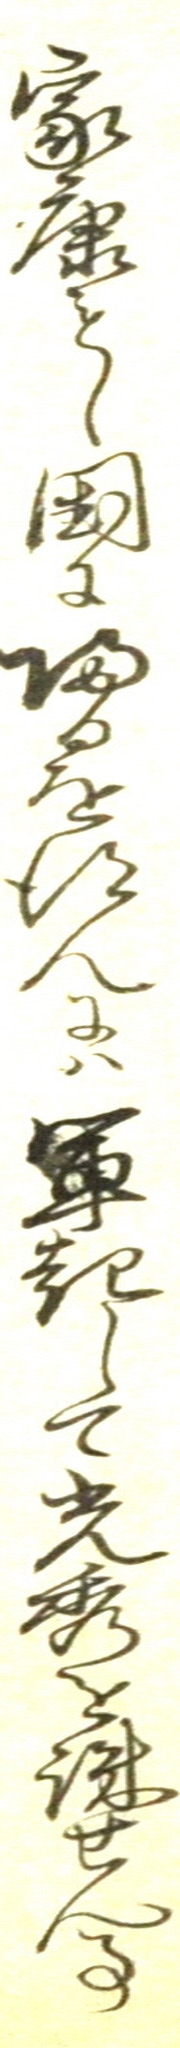家康もし国に帰るを得んには軍起して光秀を誅せん事
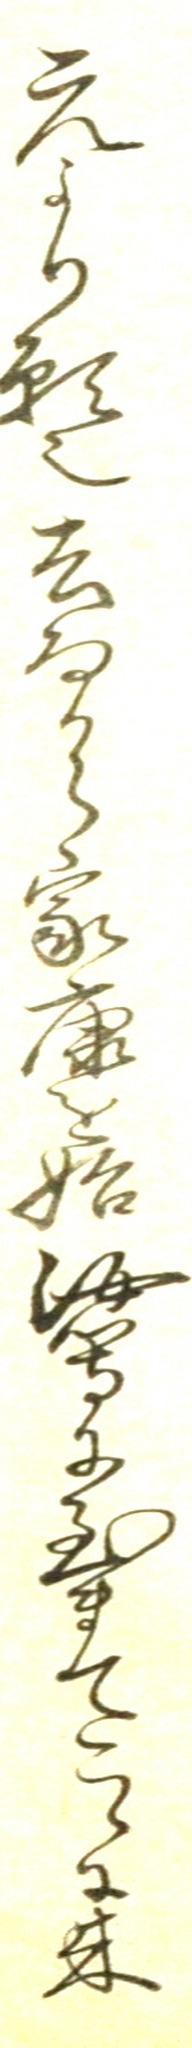元より願也去なから家康を始汝等に至まてこゝに来
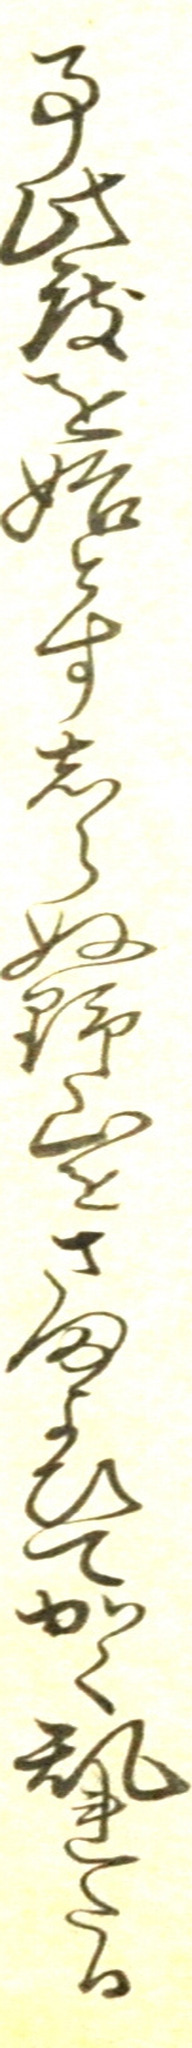事此度を始とすしらぬ野山をさまよひてかく乱れたる
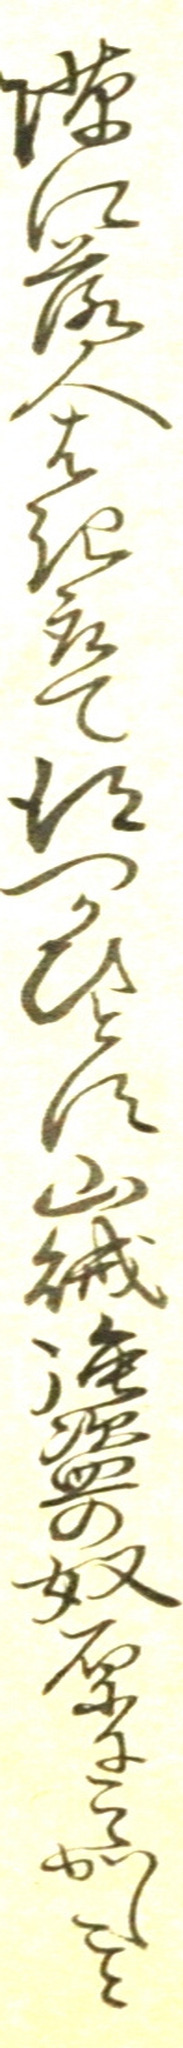隙に落人はき取て得つかひとす山賊強盗の奴原にこゝかしこと
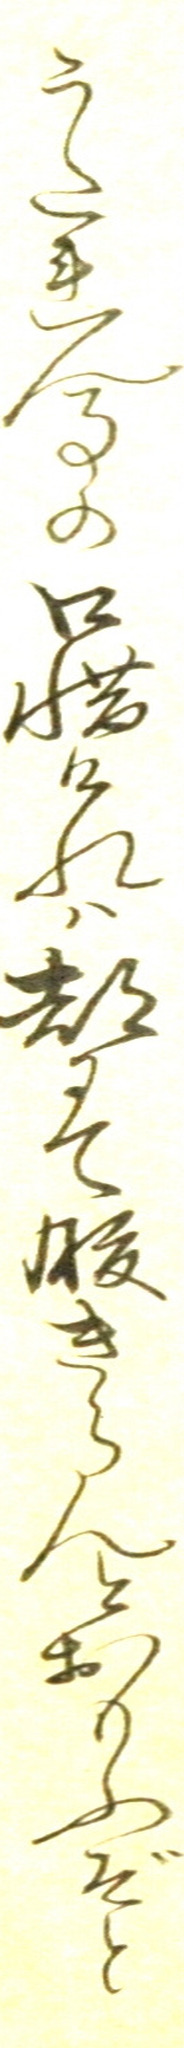うたれん事の口惜けれは都にて腹きらんとおもふぞと

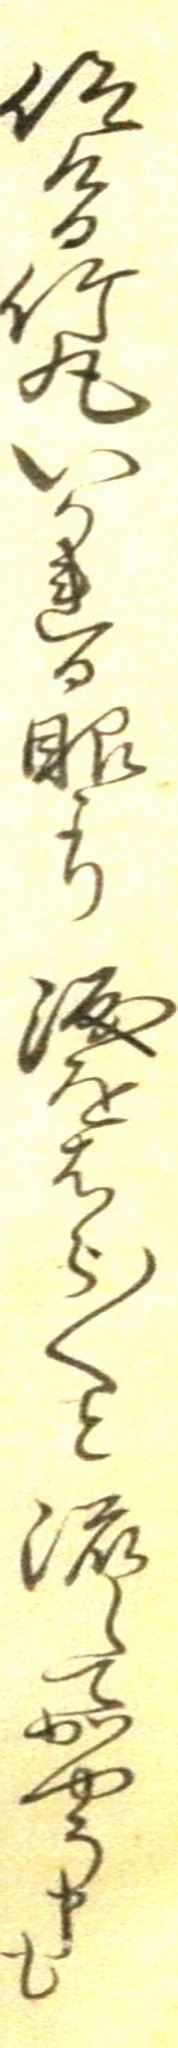仰ける竹丸いかれる眼より涙をはら〳〵と流してかやう申も
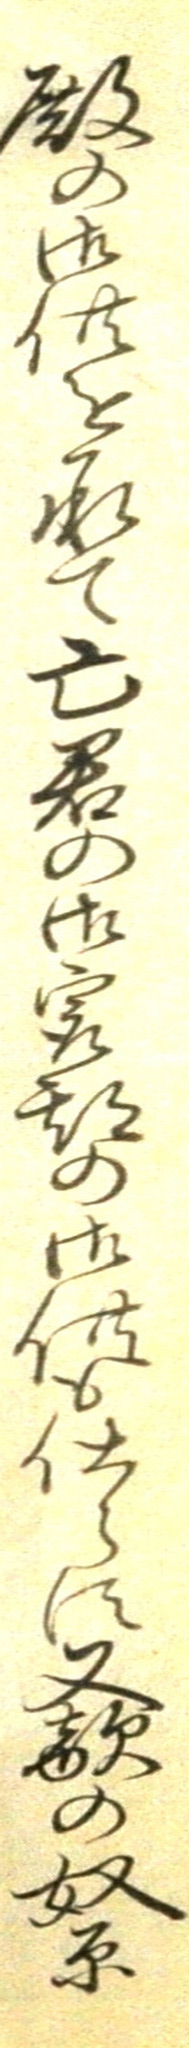殿の御供を承て亡君の御最期の御供も仕らす又敵の奴原
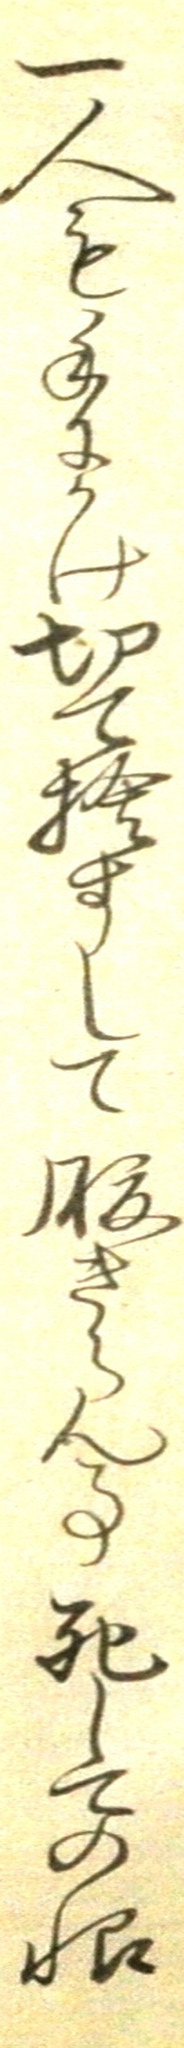一人も手にかけ切て捨すして腹きらん事死しての恨
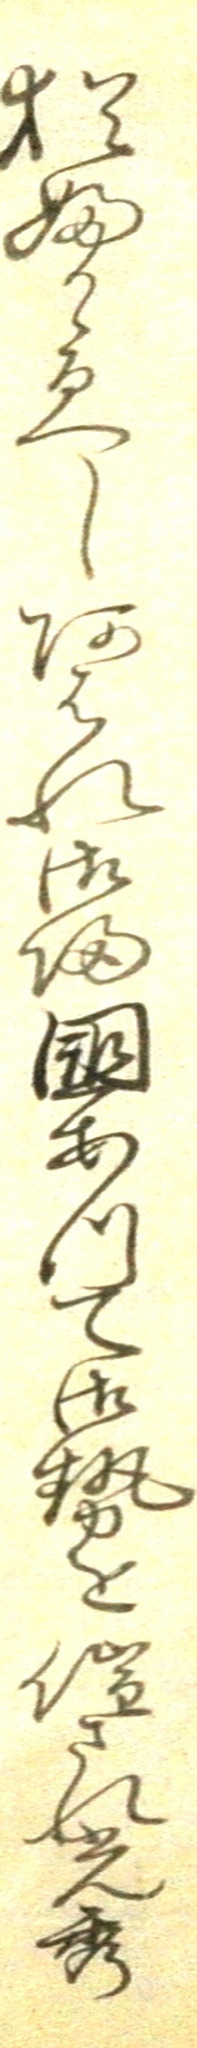猶ふかゝるへしあはれ御帰国あつて御勢を催され光秀
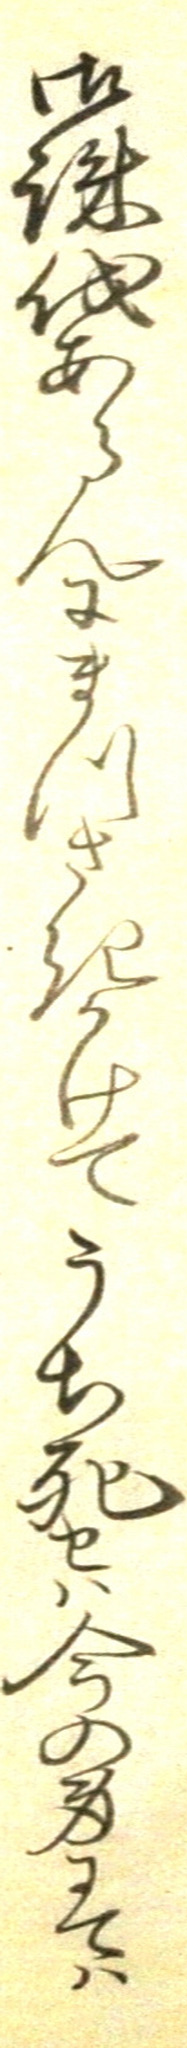御誅伐あらんにまつさきかけてうち死せは今の身にては
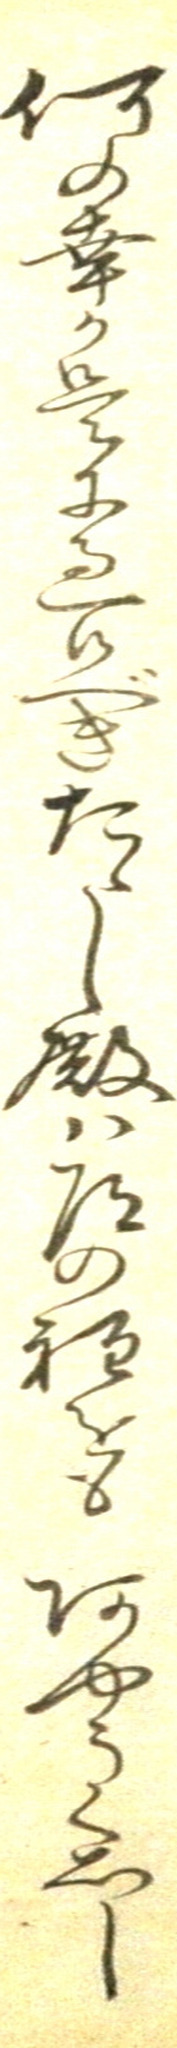何の幸か是に過候べきたゝし殿は道の程をもあやうく思し
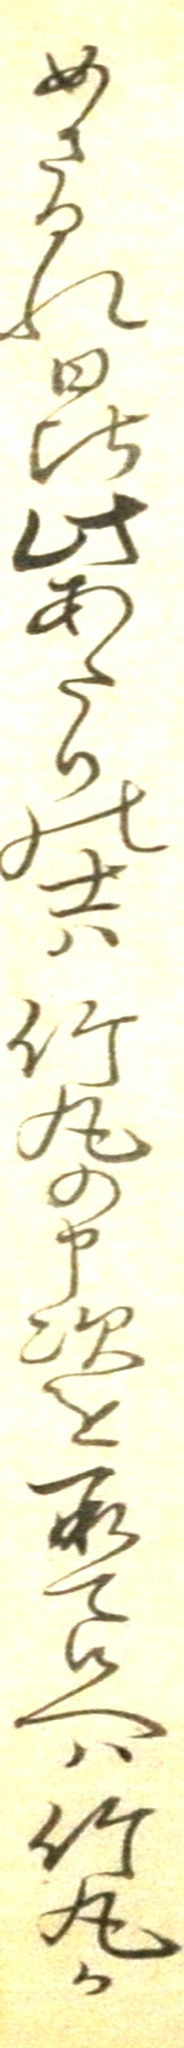めさるれ日比此あたりの士は竹丸の申次を承て候へは竹丸か
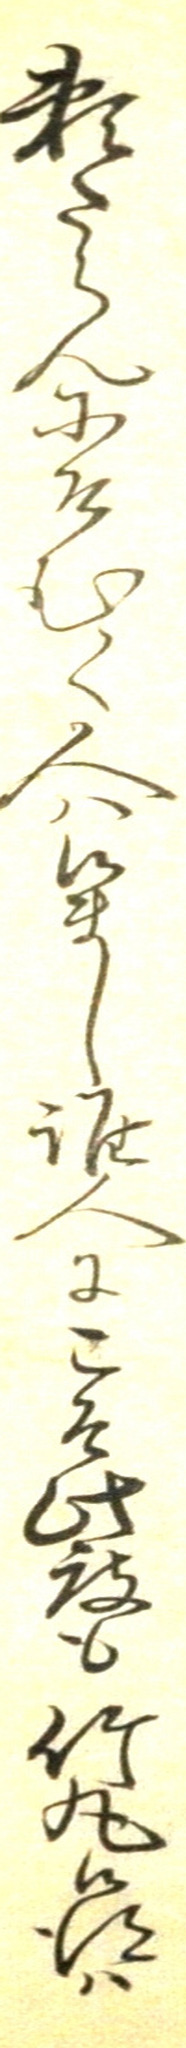頼たらんにそむく人は候まし誰人にこそ此度も竹丸候得は
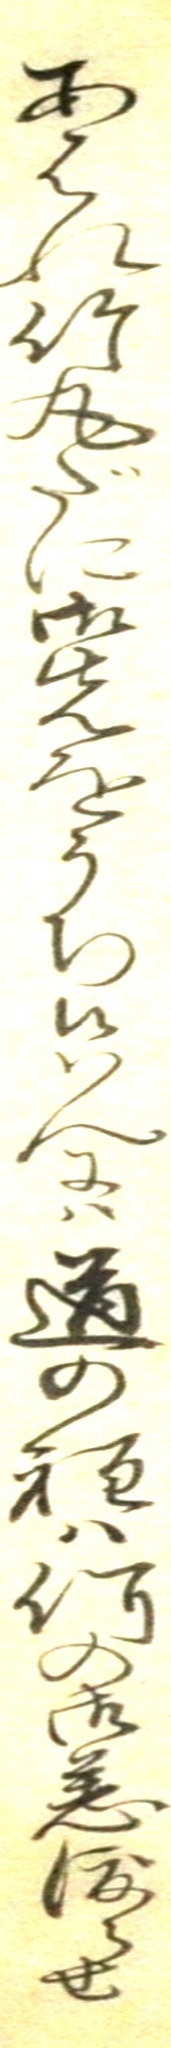あはれ竹丸だに御先をうち候はんには道の程は何の恙渡らせ
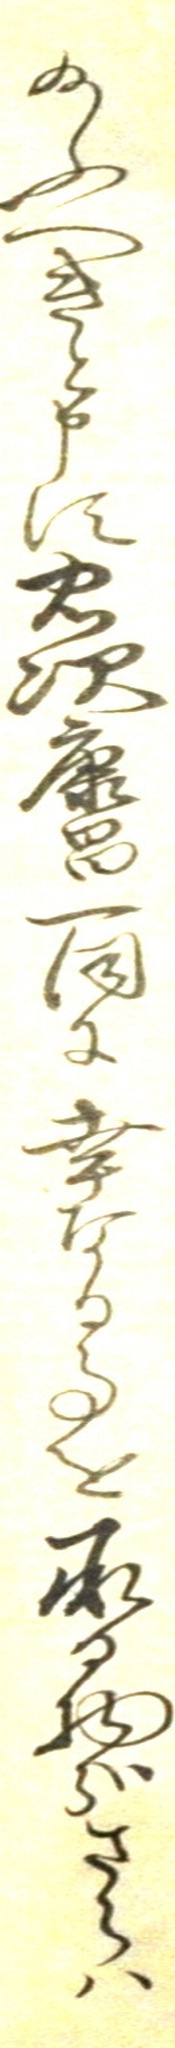給ふへきと申す忠次康昌一同に幸なる事を承る物哉さらは
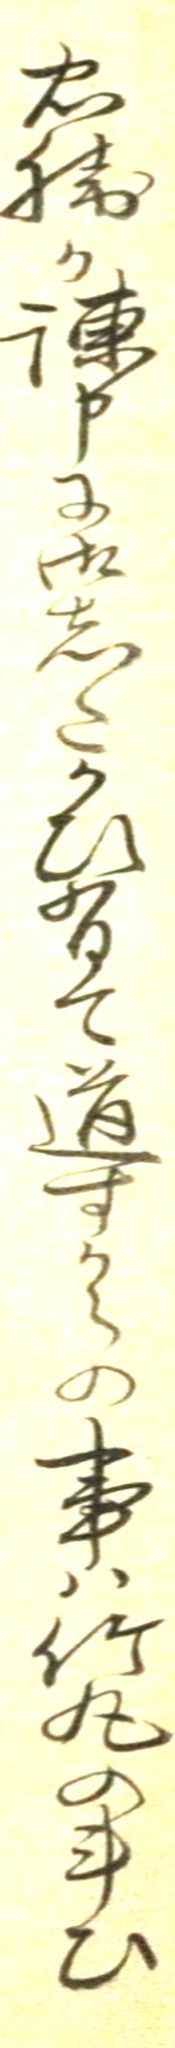忠勝か諫申に御したかひ有て道すからの事は竹丸の計ひ
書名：藩翰譜（四・上）
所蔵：伊那市立高遠町図書館・合同会社AMANE
